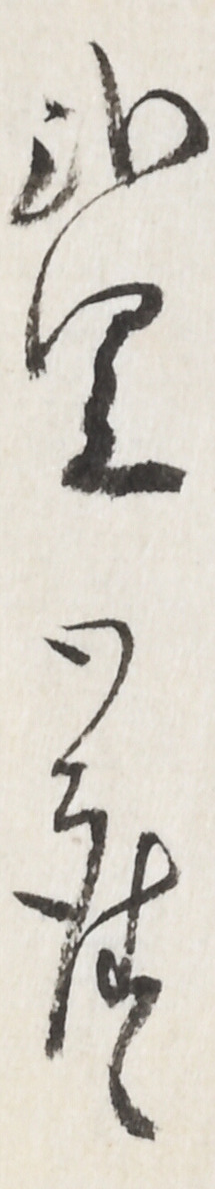弐里御座候

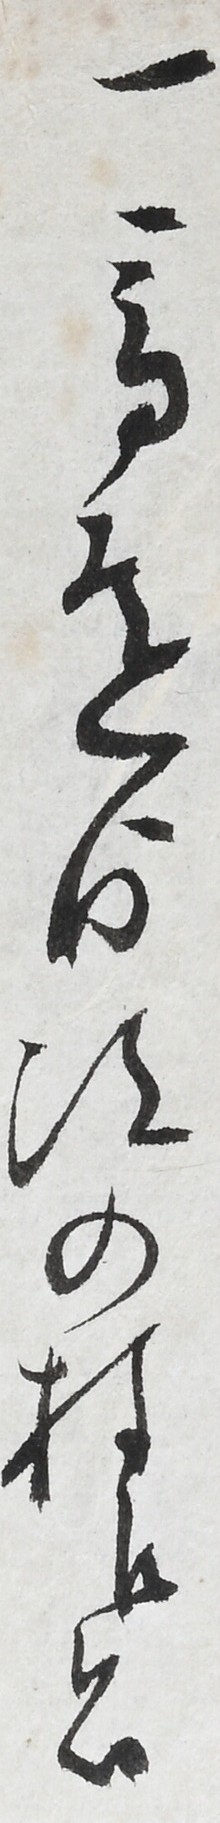一高遠ゟ次の村えは
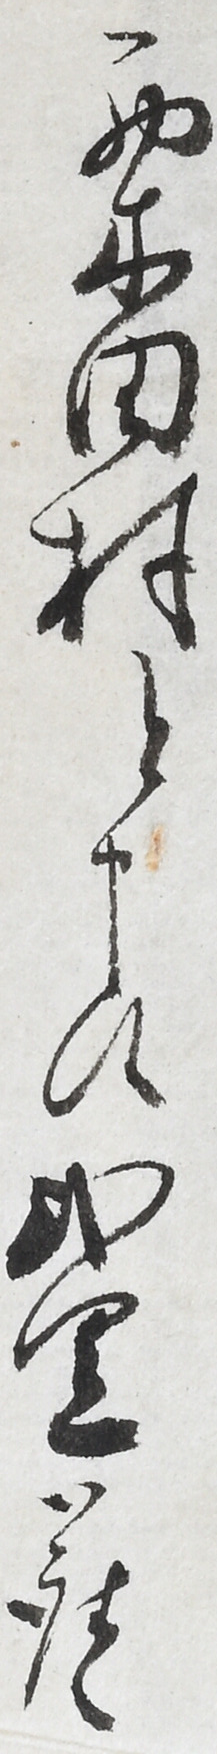栗田村と申候弐里御座候
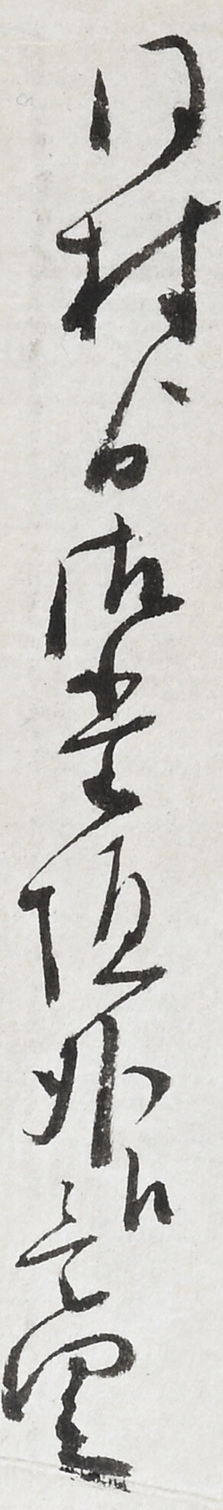同村ゟ御堂垣外え壱里
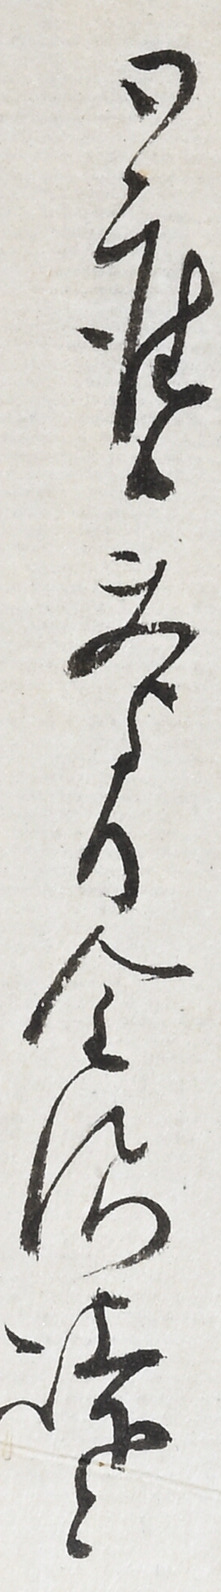御座候夫ゟ金沢峠と
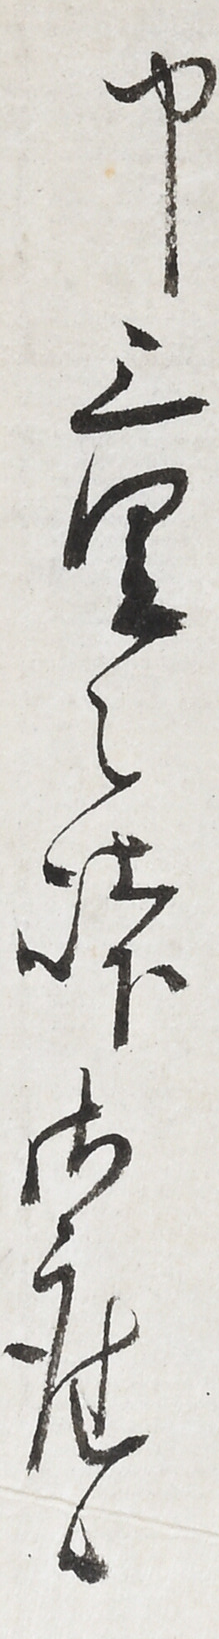申三里之峠御座候
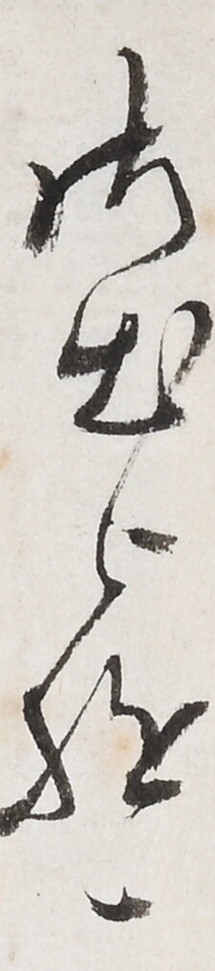御出被遊候
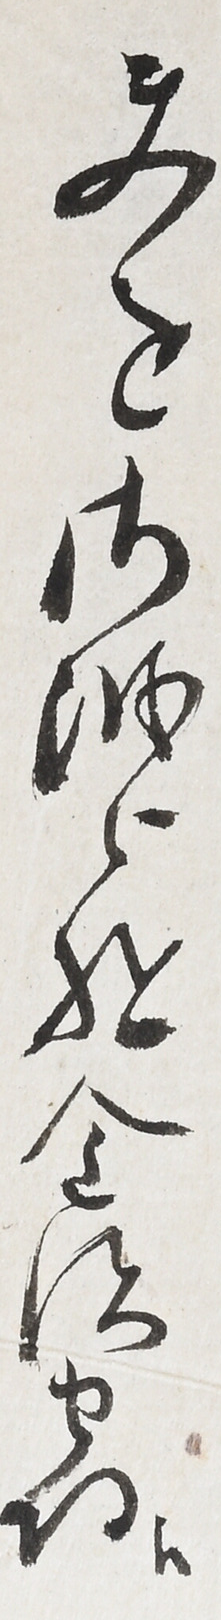夫を御越被遊金沢宿え
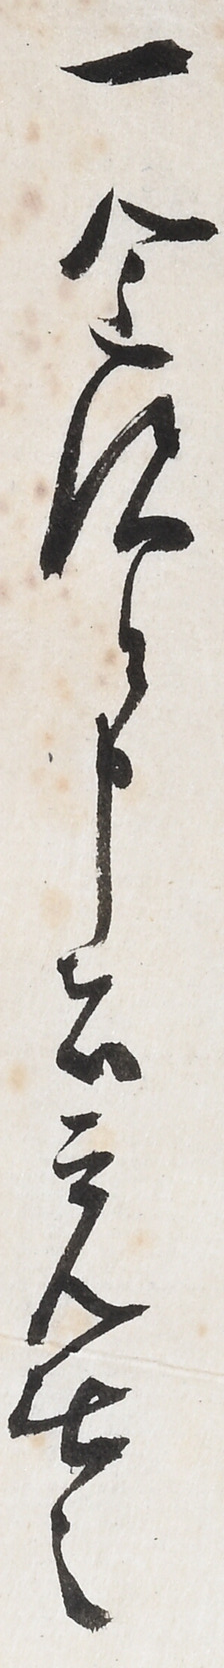一金沢と申は覚無之
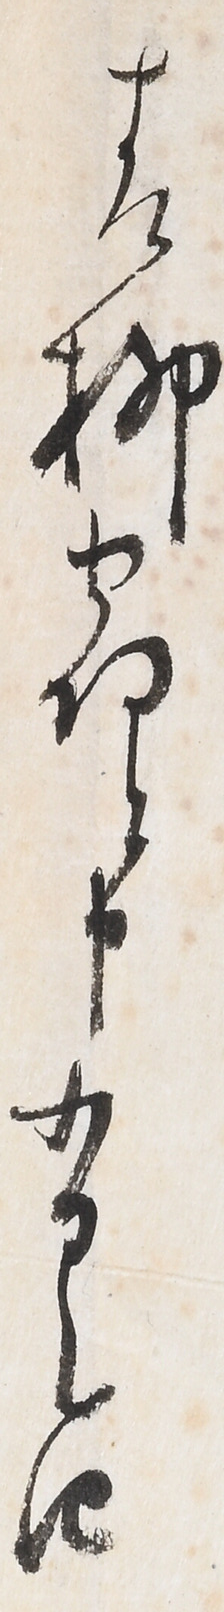青柳宿と申有之由
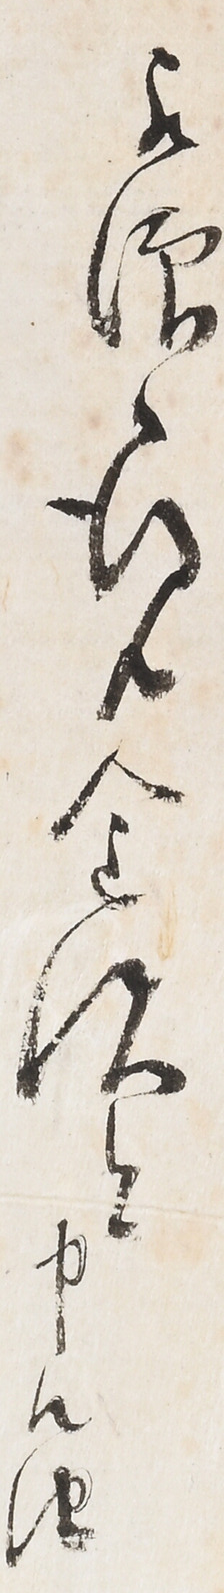被仰候得共金沢と申候由
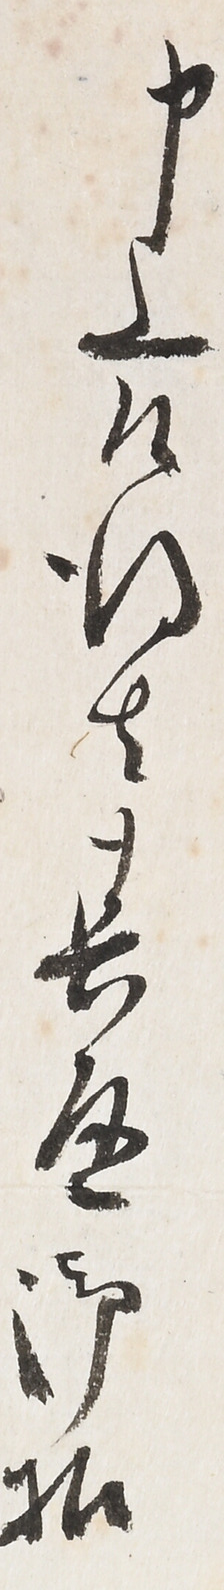申上候得は其通御払
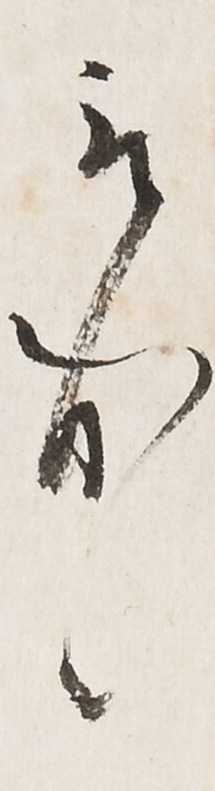被成候
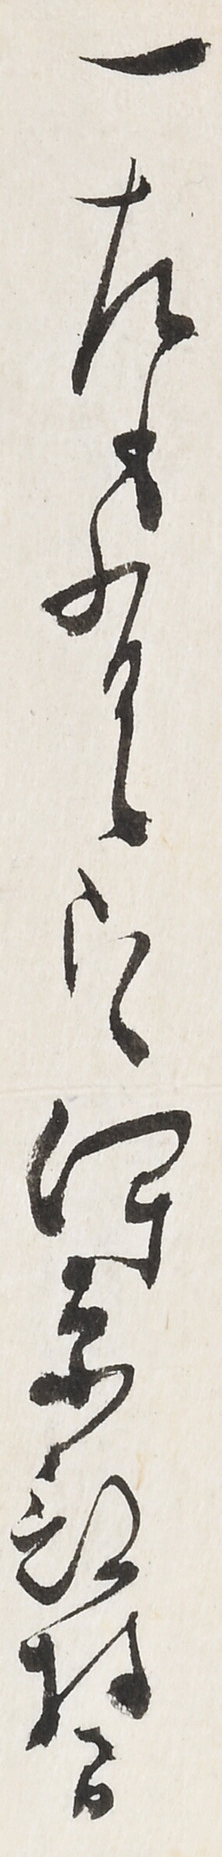一左も有之候ハヽ伊奈部村ニ而
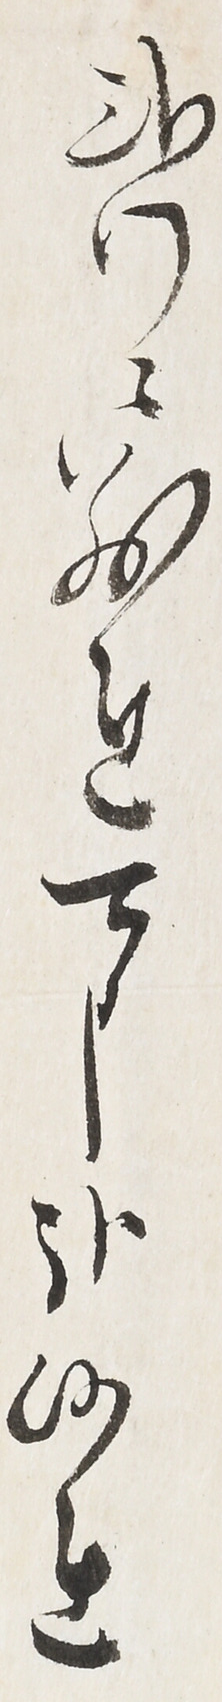弐つニ別れ可申哉何れ
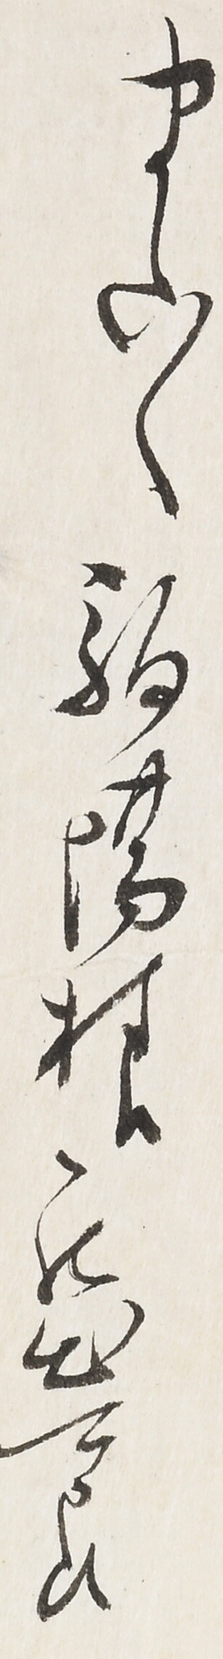また〳〵駒場村え罷出可申候
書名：御測量方御出ニ付三州迄罷出御窺聞合覚書
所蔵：伊那市立高遠町図書館・合同会社AMANE
